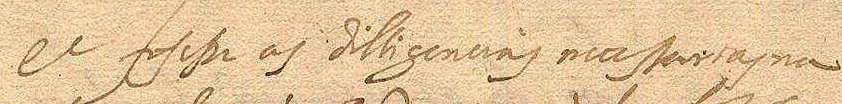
& fesesse as dilligencias necessarias na
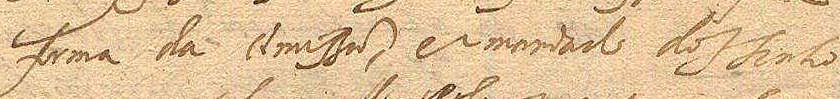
forma da cōmissaõ, e mandado dos Senho
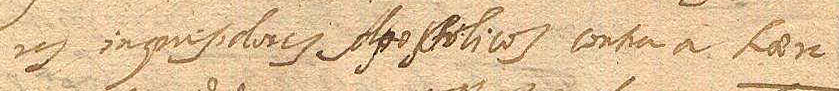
res inquisidores Apostolicos contra a hære
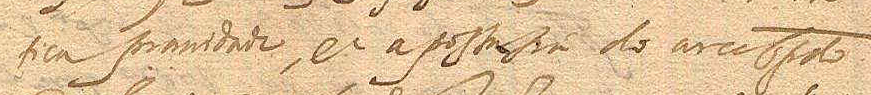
tica prauidade, e apostasia do arcēbpdo
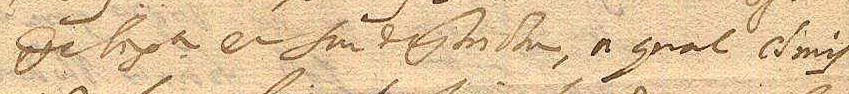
de lxa e seu destricto, a qual cōmis
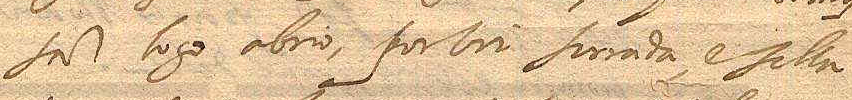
saõ logo abrio, por vir serrada, e sella
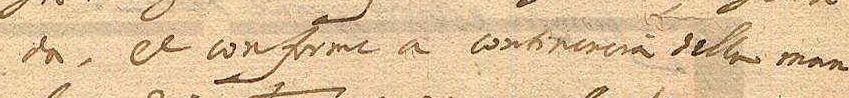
da, & conforme a continencia della man
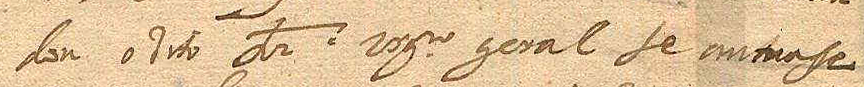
dou o dito s̄or. vig.ro geral se autuase
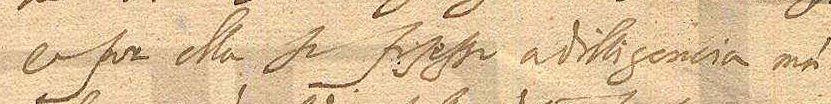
e por ella se fizesse a dilligencia mā
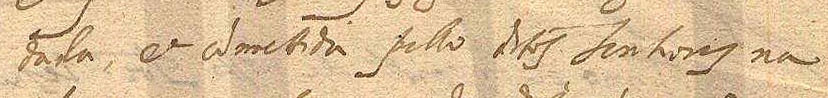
dada, & cōmetida pello ditos senhores na
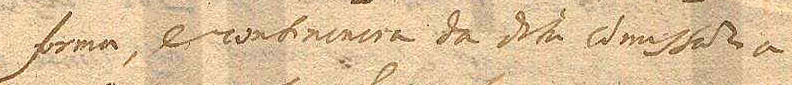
forma, e continencia da dita cōmissaõ a
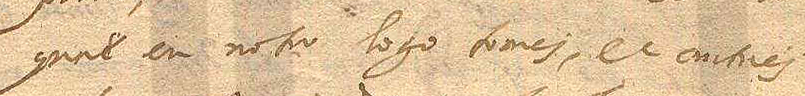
qual eu notro logo tomej, & emtrej
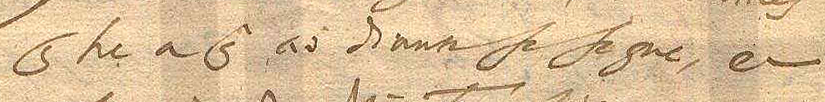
q̄ he a q̄ ao diante se segue, e
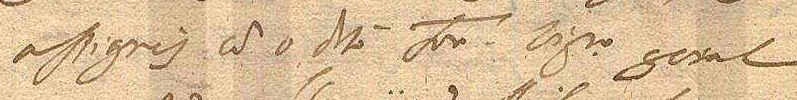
assignej cō o dito s̄or vigr.o geral
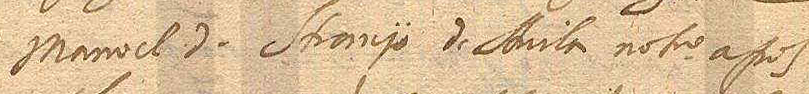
Manoel de Araujo de Auila notro apos
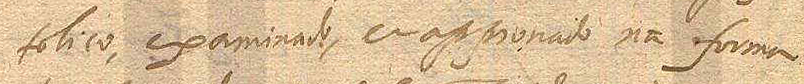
tolico, examinado, e approuado na forma
